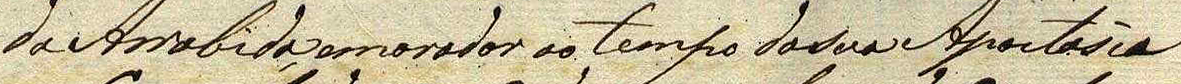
da Arrabida e morador ao tempo da sua Apostasia
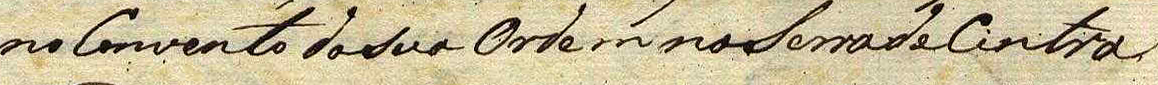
no Convento da sua Ordem na Serra de Cintra
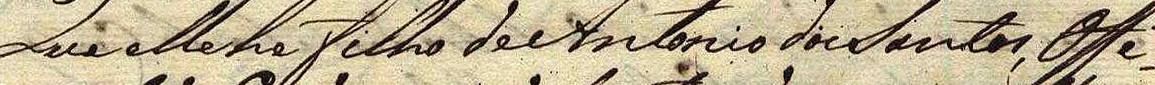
Que elle he filho de Antonio dos Santos, Offe
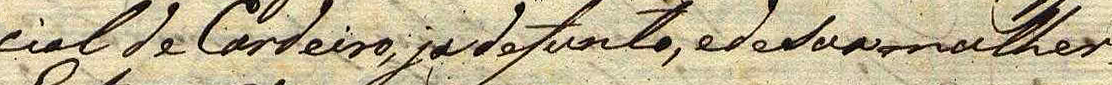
cial de Cordeiro, ja defunto, e de sua mulher
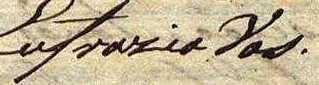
Eufrasia Vas.
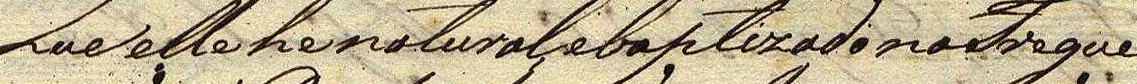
Que elle he natural baptizado na Fregue
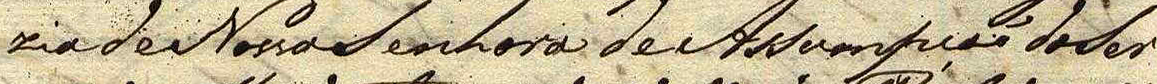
zia de Nossa Senhora de Assumpçaõ da Ser
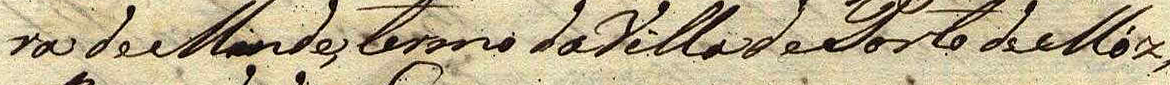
ra de Minde, termo da Villa de Porto de Móz,
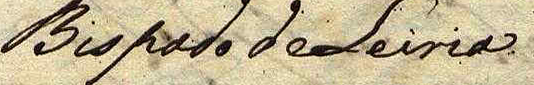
Bispado de Leiria.
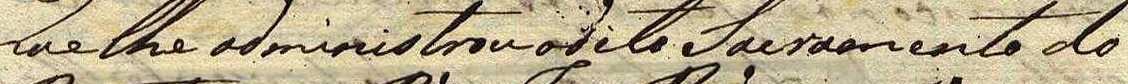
Que lhe administrou o dito Sacramento do
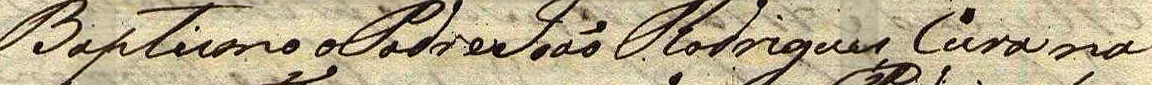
Baptismo o Padre Joaõ Rodrigues Cura na
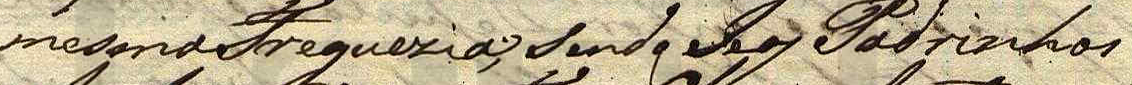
mesma Freguezia; sendo seos Padrinhos
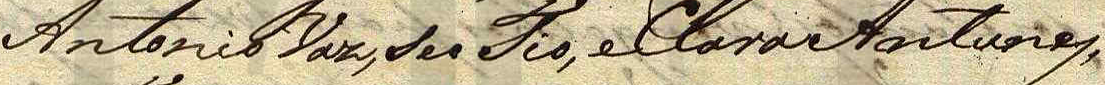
Antonio Vaz, seo Tio, e Clara Antunes,
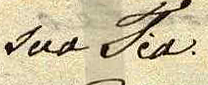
sua Tia.
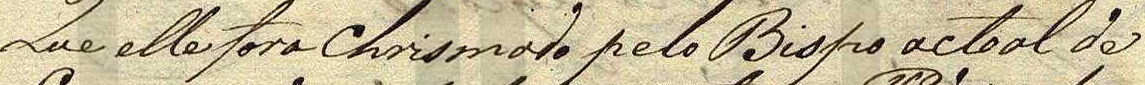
Que elle fora chrismado pelo Bispo actoal de
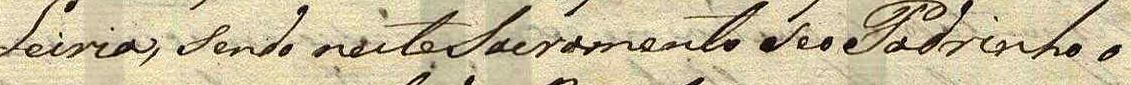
Leiria, sendo neste Juramento seo Padrinho o
